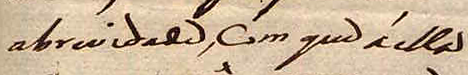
a brevidade, com que a ella
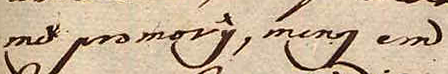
me promovy, menos em
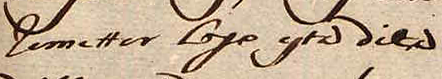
remetter Logo esta dita
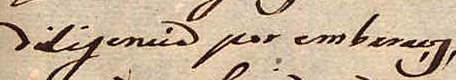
diligencia por embaraços,
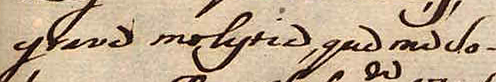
estava molestia, que me So
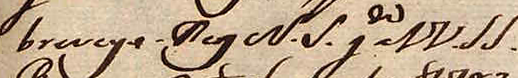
breveyo. Deos N. S. g.de a VV.SS.
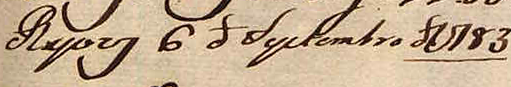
Rapozos 6 d̄ septembro d̄ 1783
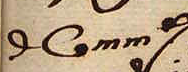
O Comm.o
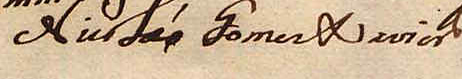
Nicoláo Gomes Xavier
